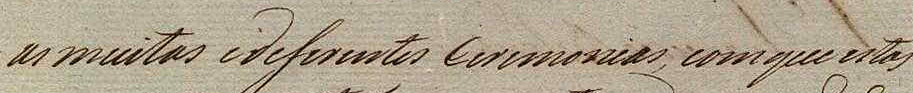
as muitas e diferentes Ceremonias, com que estas
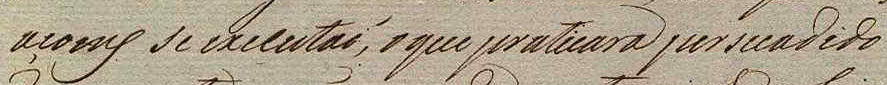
açoens se executaõ, o que praticara persuadido
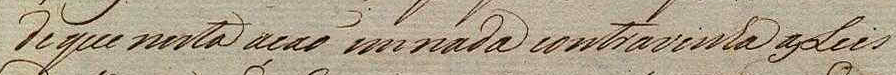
de que nesta açaõ em nada contravinha as Leis
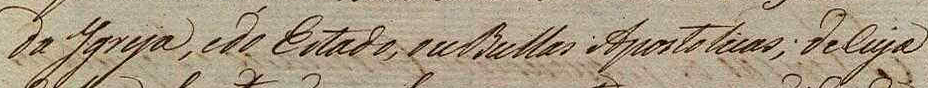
da Jgreja, e do Estado, ou Bullas Apostolicas; de Cuja
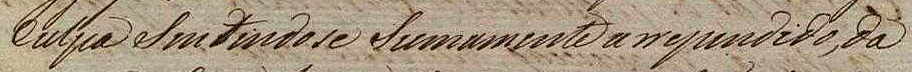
Culpa Sentindose sumamente arrependido, da
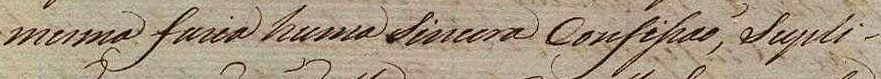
mesma fazia huma sincera confissaõ, supli
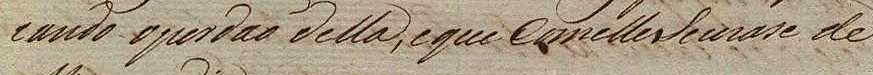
cando o perdaõ della, e que com elle se uzase de
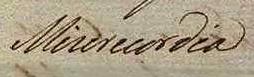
Mizerecordia
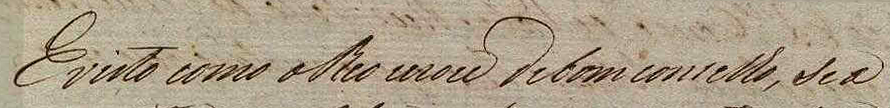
E visto como o Reo uzou de bom conselho, se a
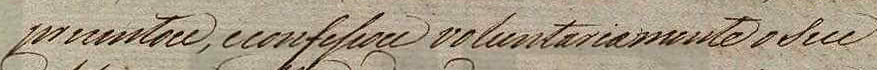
prezentou, e confessou voluntariamente o seu
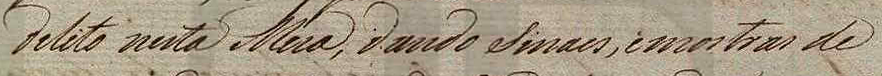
delito nesta Meza, dando sinaes, e mostras de
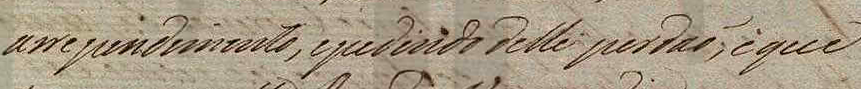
arrependimento, e pedindo delle perdaõ, e que
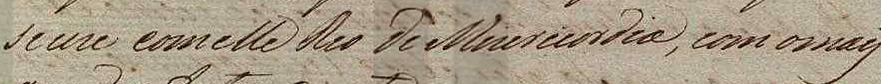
se uze com elle Reo de Misericordia, com o mais
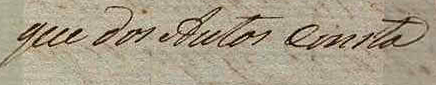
que dos Autos consta
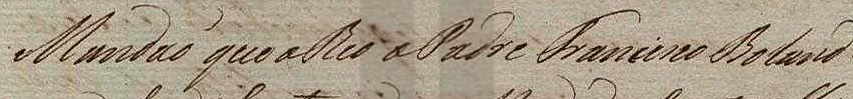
Mandaõ que o Reo o Padre Francisco Boland
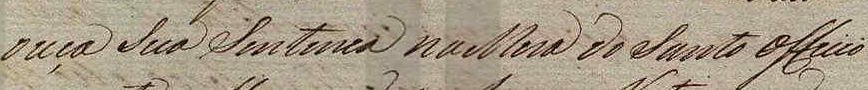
ouça sua Sentença na Mesa do Santo Officio
